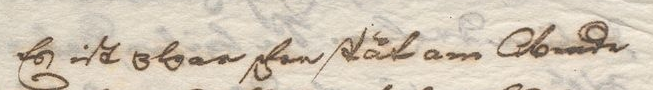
Es ist zwar schon spät am Abende
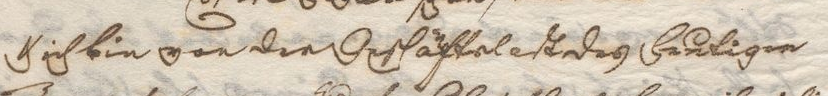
& ich bin von der Geschäftslast des heutigen
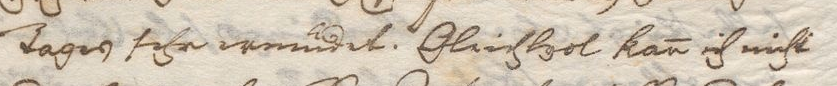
Tages sehr ermüdet. Gleichwol kann ich nicht
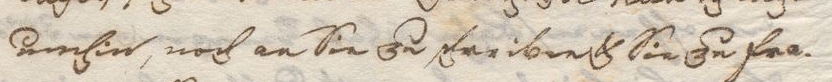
umhin, noch an Sie zu schreiben & Sie zu fra-
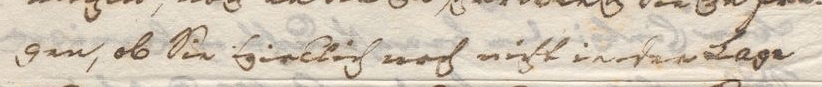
gen, ob Sie wirklich noch nicht in der Lage
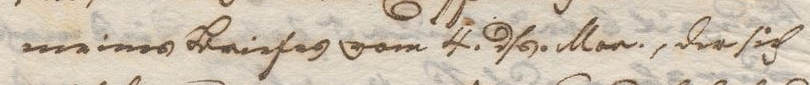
meines Briefes vom 4. dss. Mon., der sich
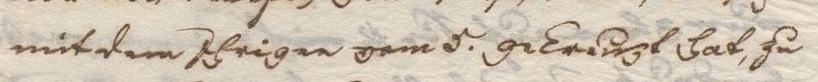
mit dem Ihrigen vom 5. gekreuzt hat, zu
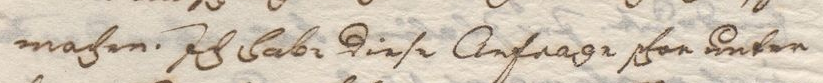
machen. Ich habe diese Anfrage schon unter
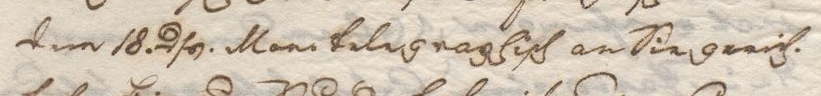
dem 18. dss. Mon. telegraphisch an Sie gerich-
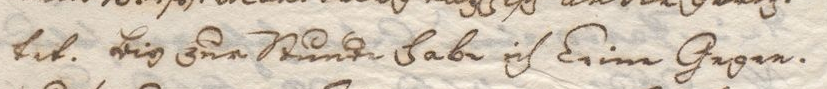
tet. Bis zur Stunde habe ich keine Gegen-
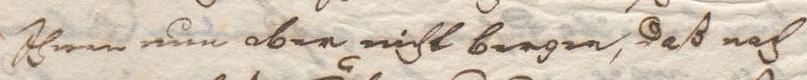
Ihnen nun aber nicht bergen, daß nach
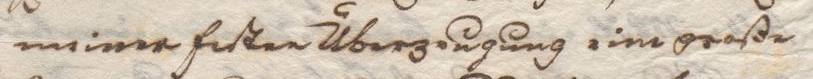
meiner festen Überzeugung eine große
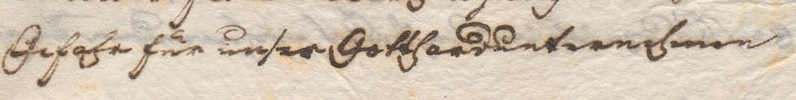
Gefahr für unser Gotthardunternehmen
